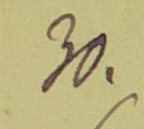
30
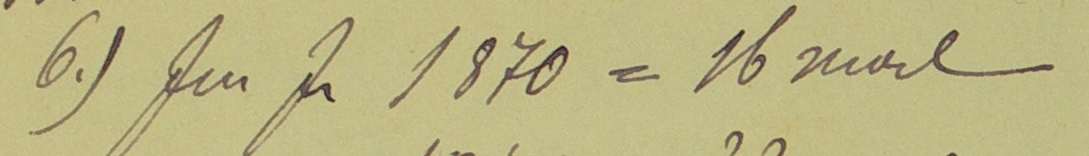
6) Im Jahr 1870 = 16 mal
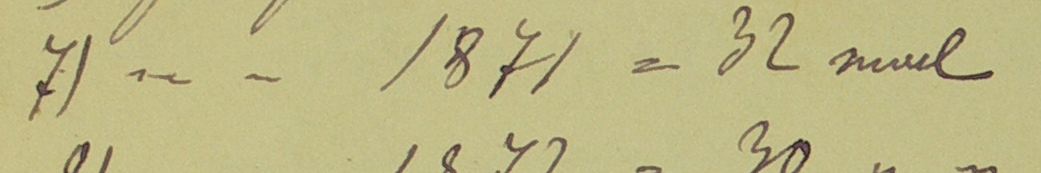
7) * 1871 = 32 mal
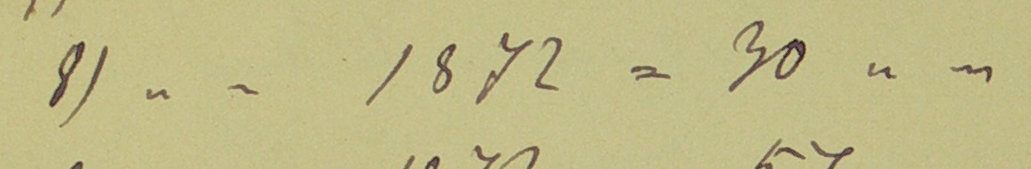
8) * 1872 = 30 mal
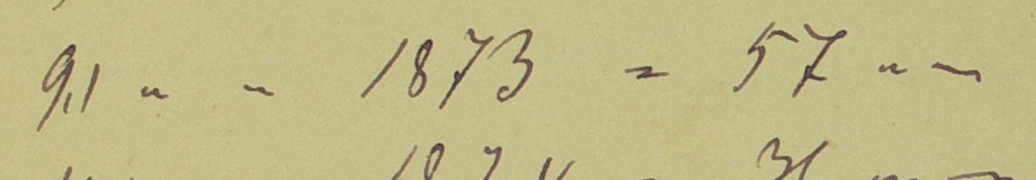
9) * 1873 = 57 mal
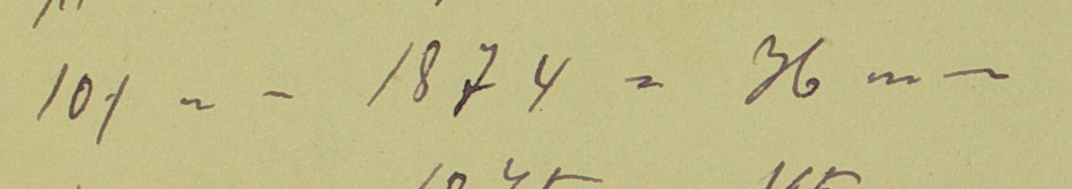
10) * 1874 = 36 mal
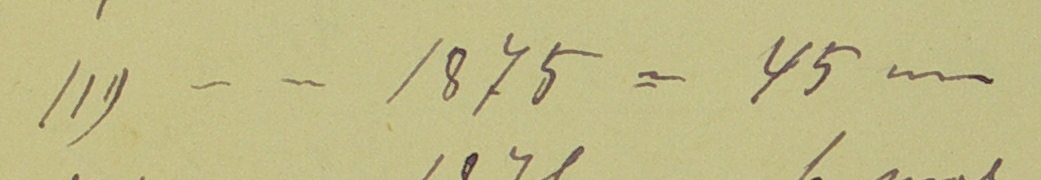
11) * 1875 = 45 mal
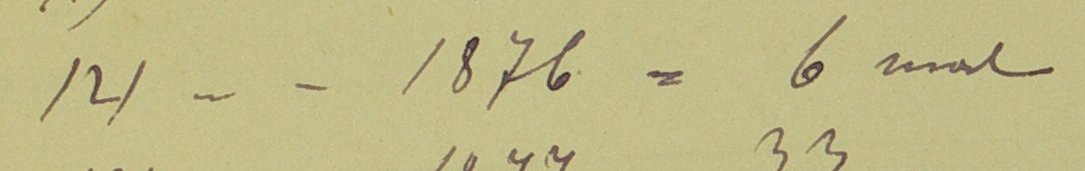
12) * 1876 = 6 mal
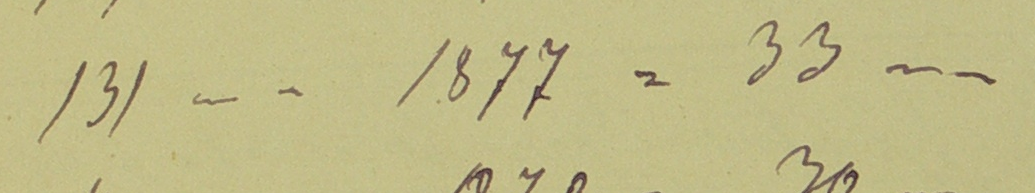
13) * 1877 = 33 mal
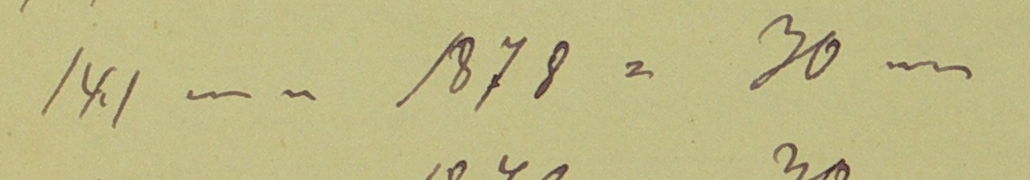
14) * 1878 = 30 mal
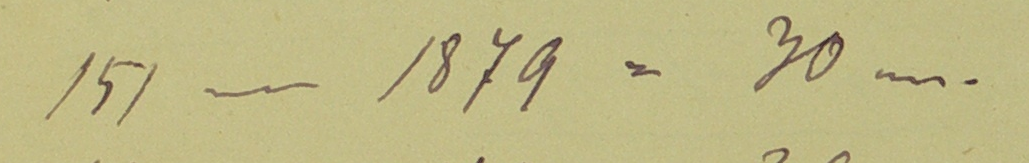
15) * 1879 = 30 mal
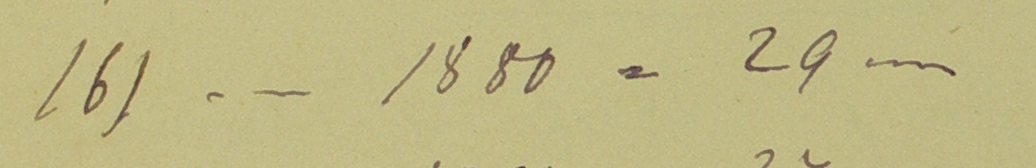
16) * 1880 = 29 mal
